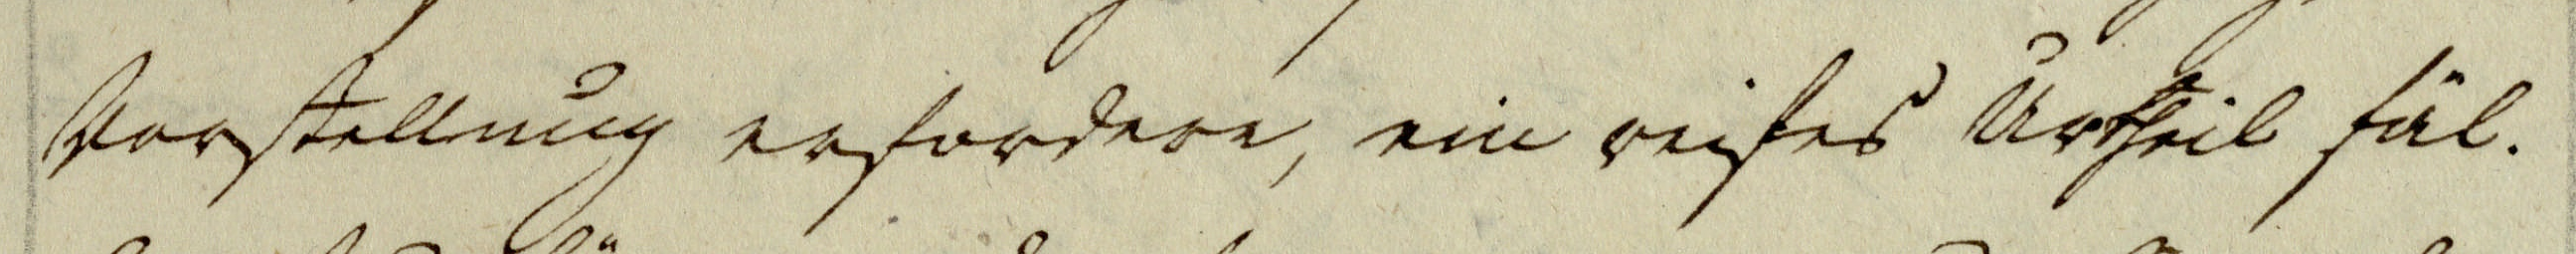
Vorstellung erfordere, ein reifes Urtheil fäl¬
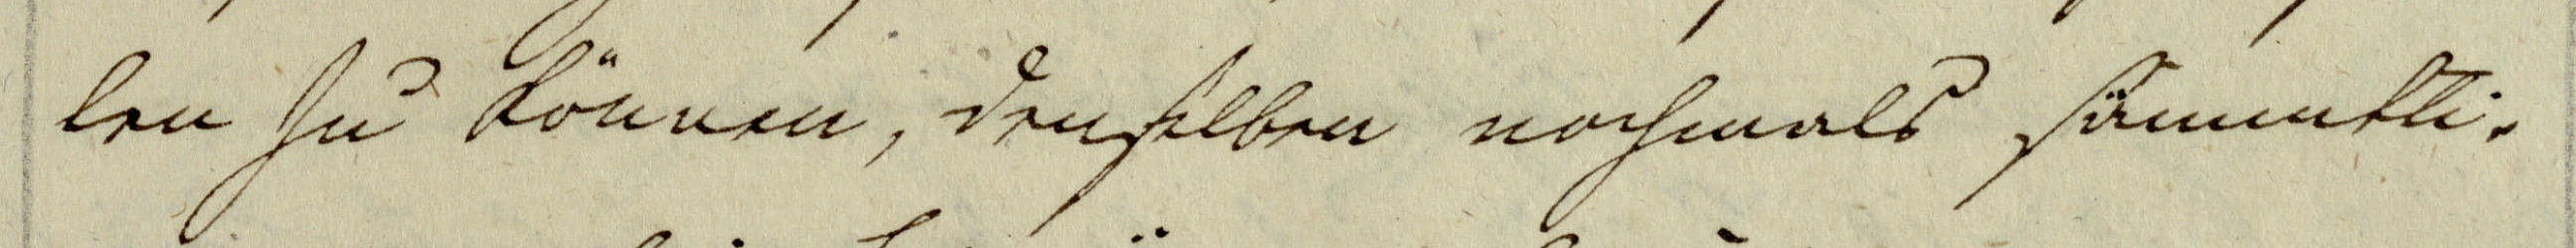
len zu können, denselben nochmals sämmtli¬
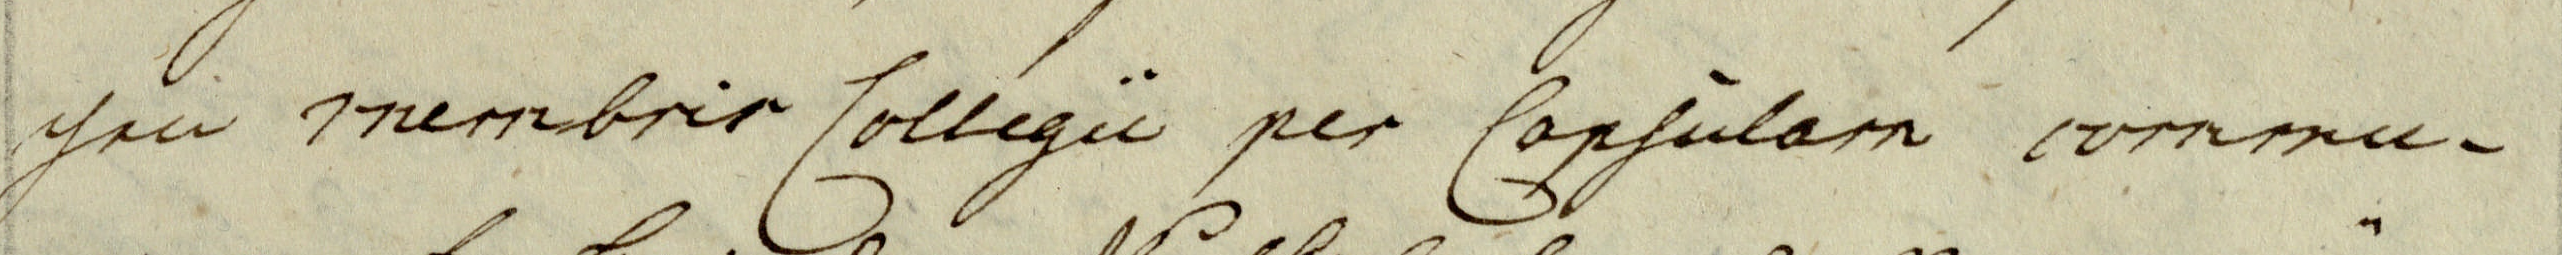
chen membris Collegii per Capsulam commu¬
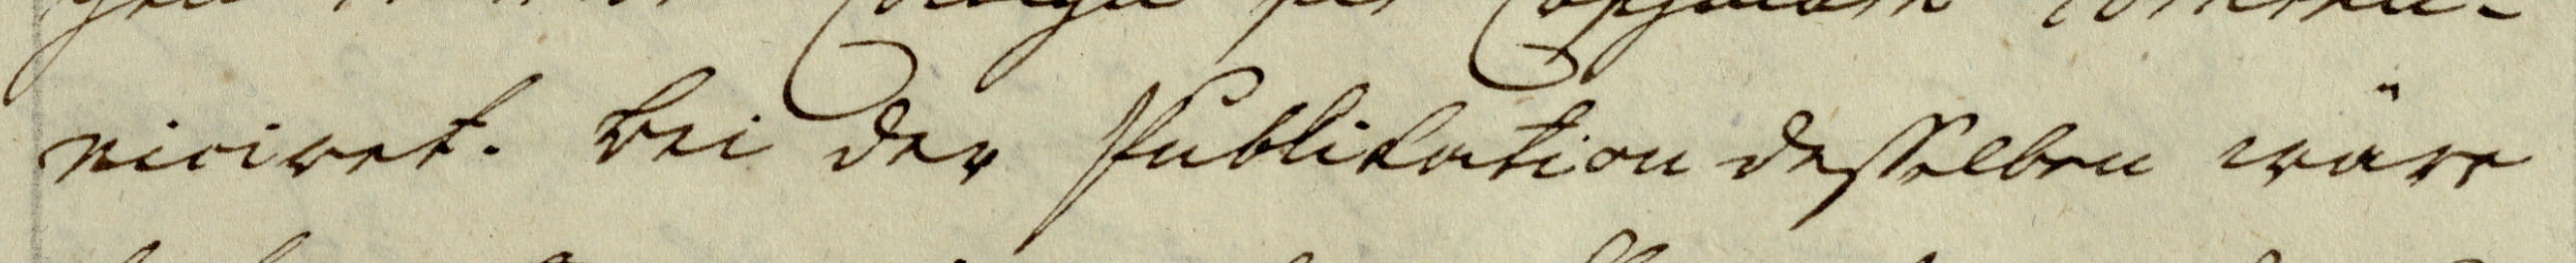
niciret. Bei der Publikation desselben wäre
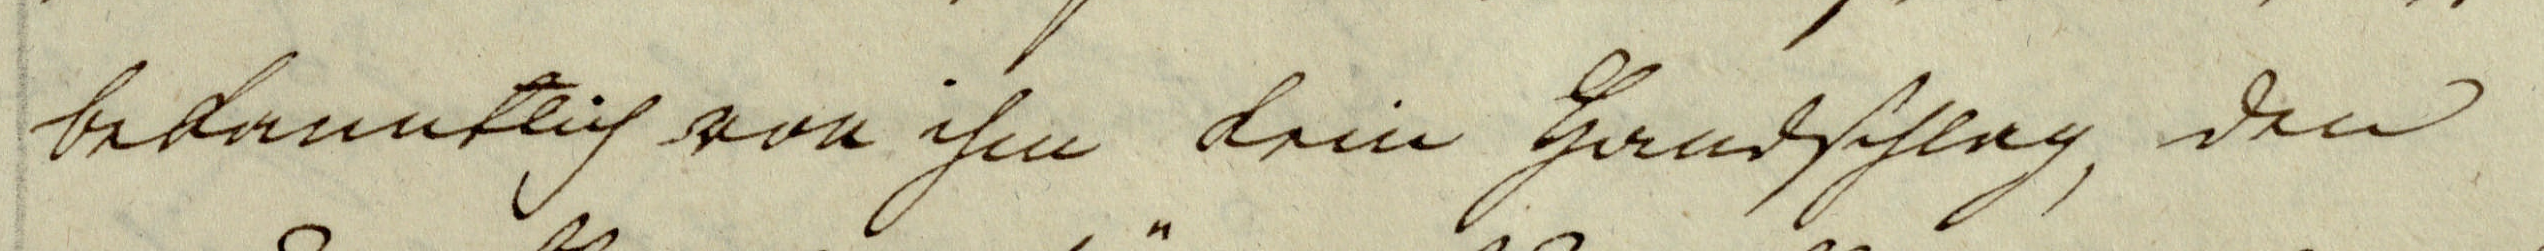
bekanntlich von ihm kein Handschlag, den
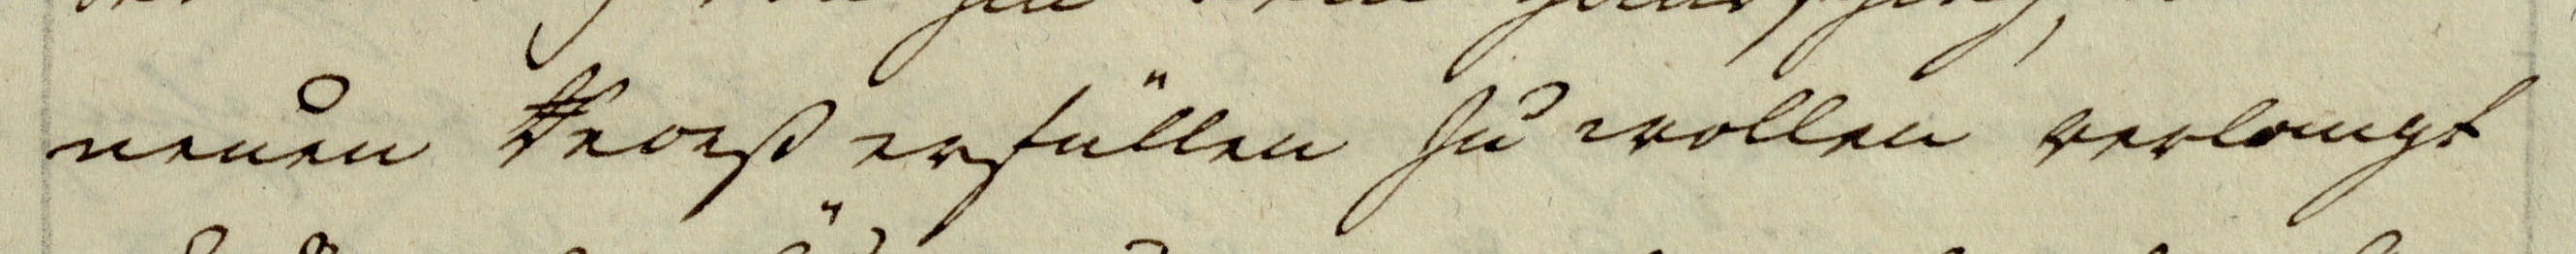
neuen Receß erfüllen zu wollen verlangt
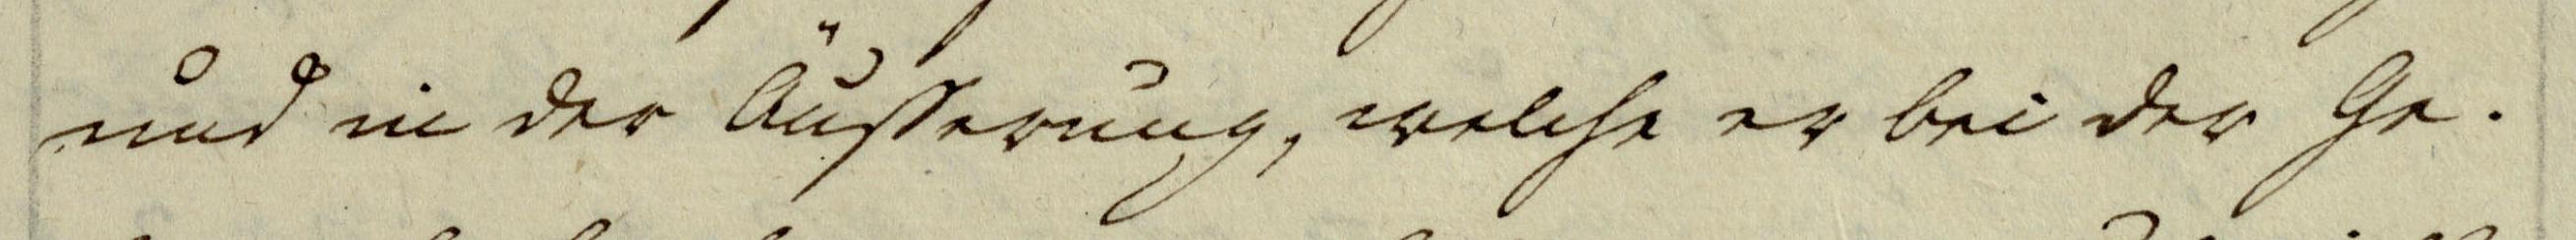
und in der Äusserung, welche er bei der Ge¬
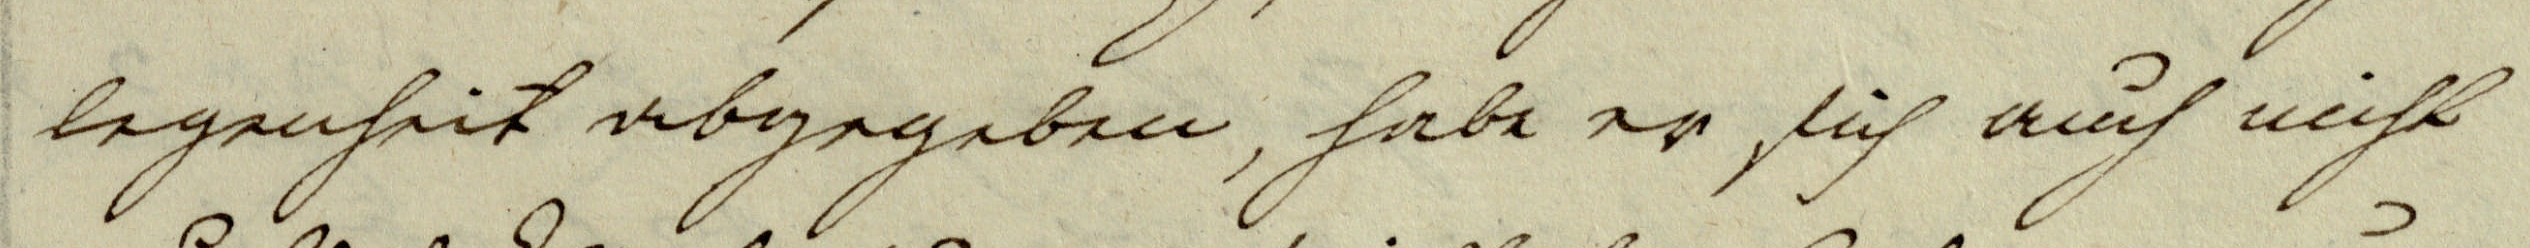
legenheit abgegeben, habe er sich auch nicht
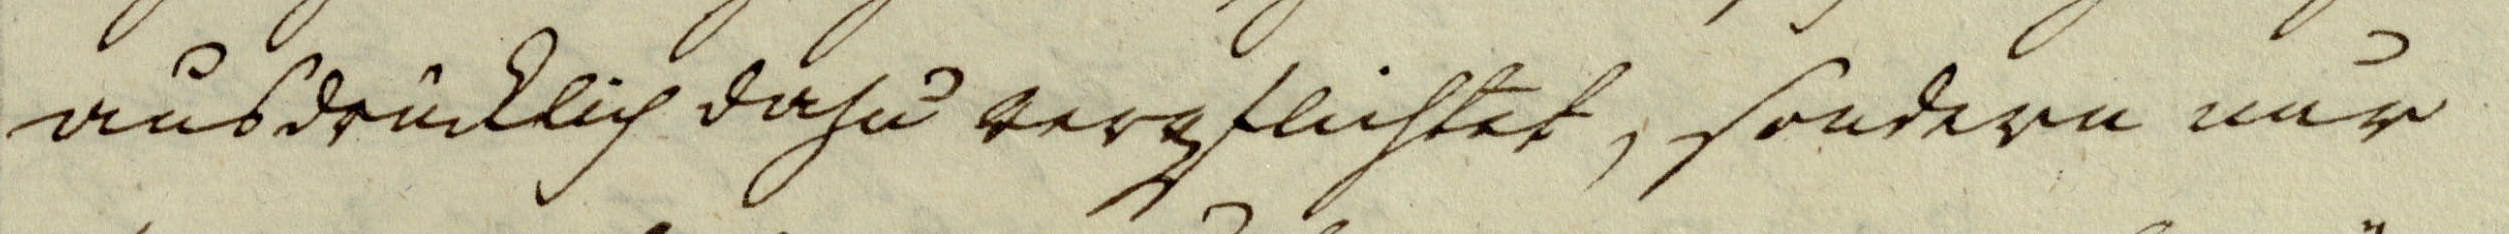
ausdrücklich dazu verpflichtet, sondern nur
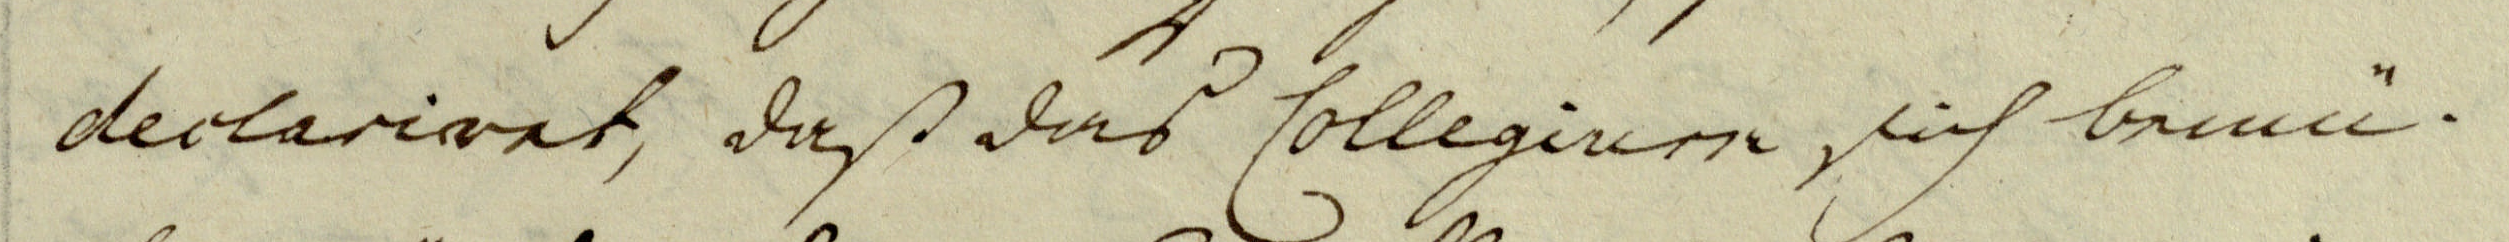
declariret, daß das Collegium sich bemü¬
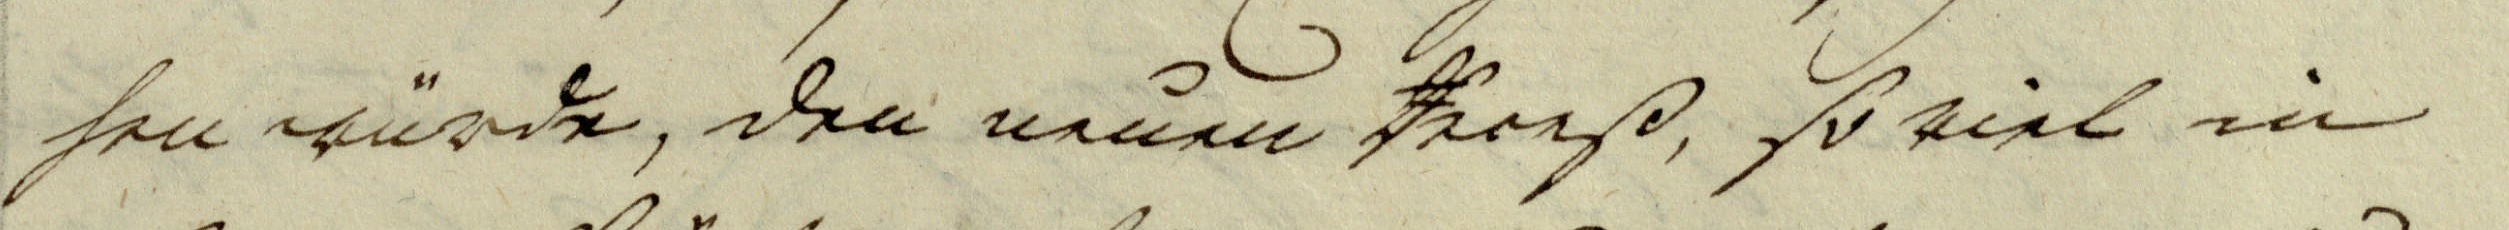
hen würde, den neuen Receß, so viel in
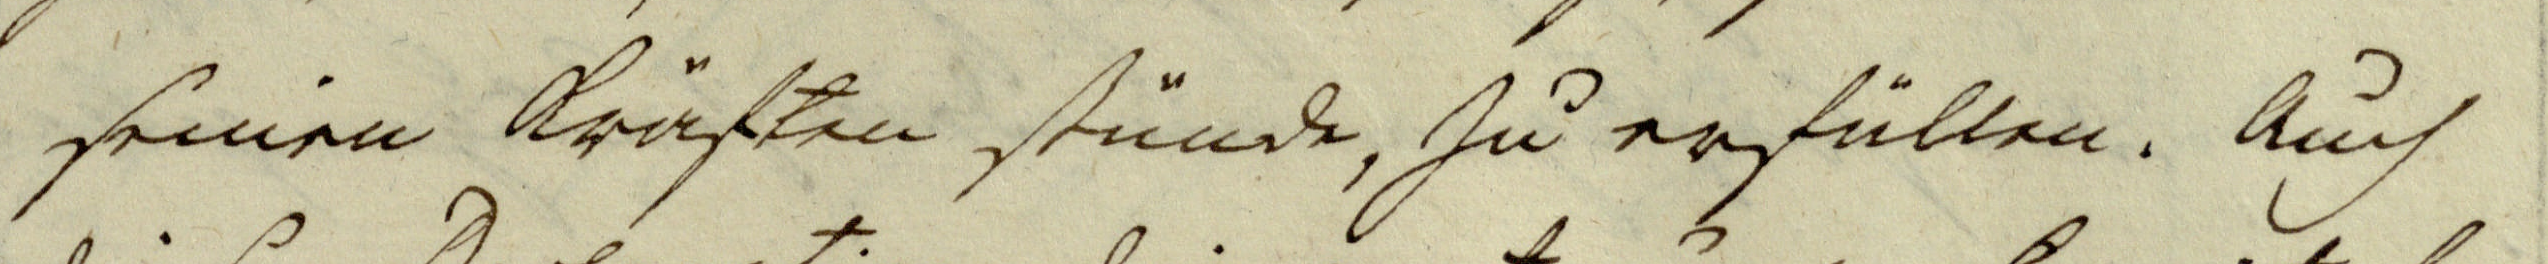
seinen Kräften stünde, zu erfüllen. Auch
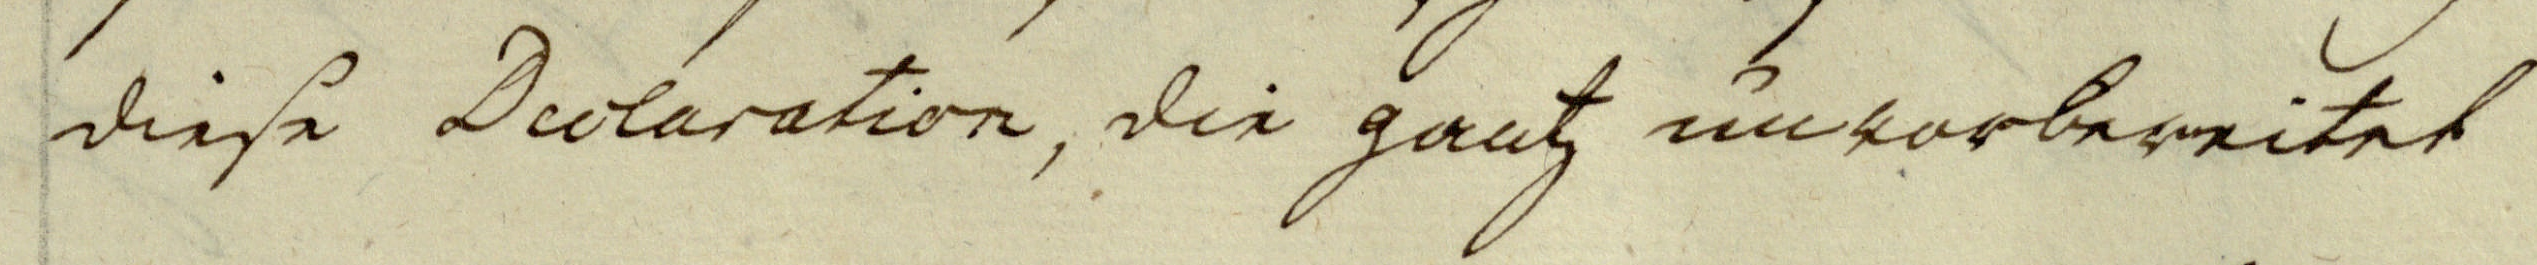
diese Declaration, die gantz unvorbereitet
